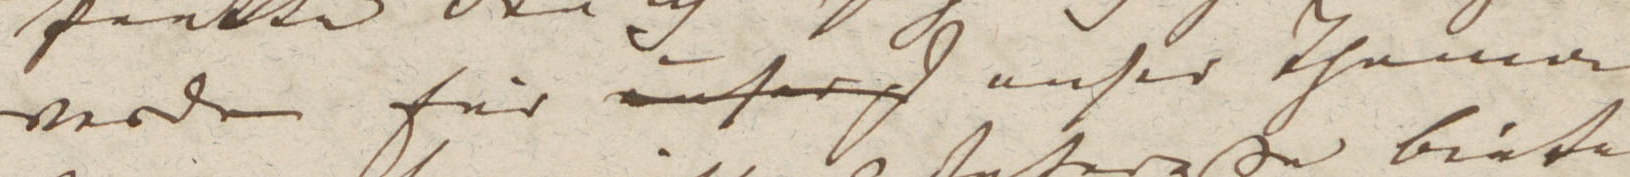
werde für unser I unser Thema
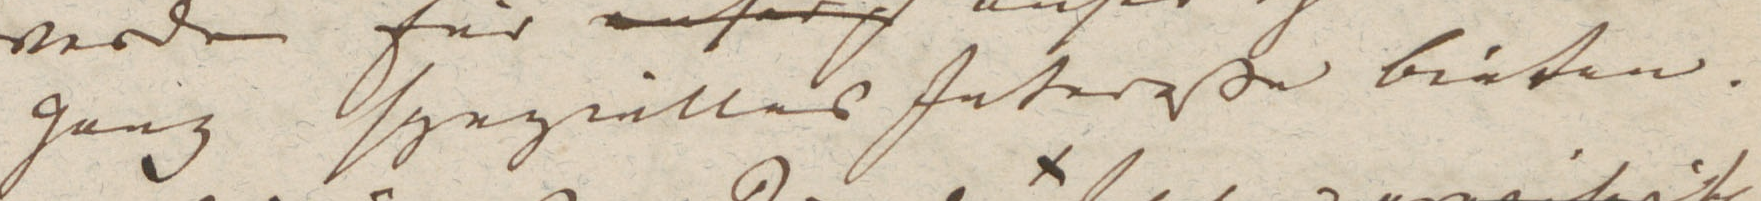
ganz spezielles Interesse bieten.
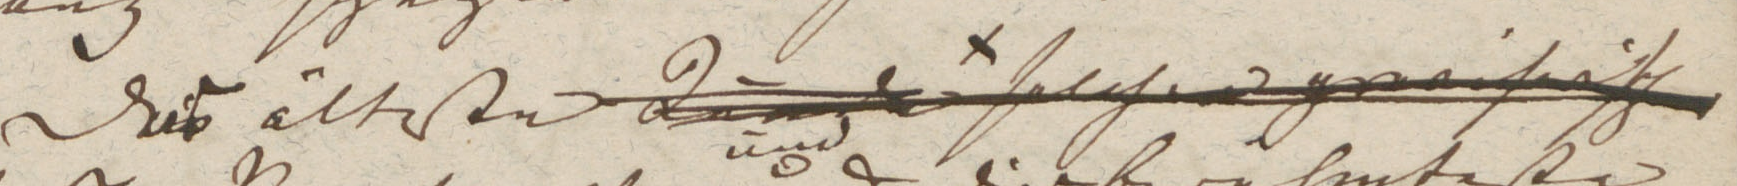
Das älteste Kunde solcher provisorisch %
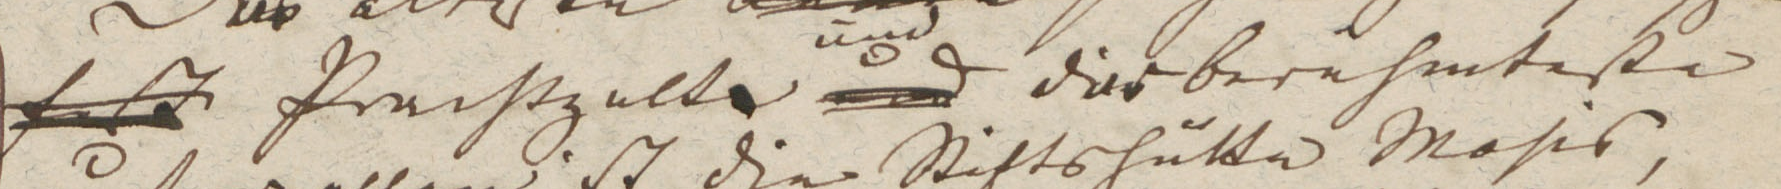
fast Prachtzelte und und dieer berühmteste
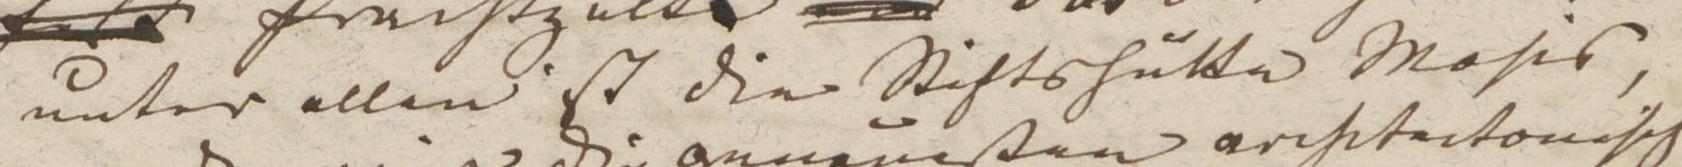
unter allen ist die Stiftshütte Mosis,
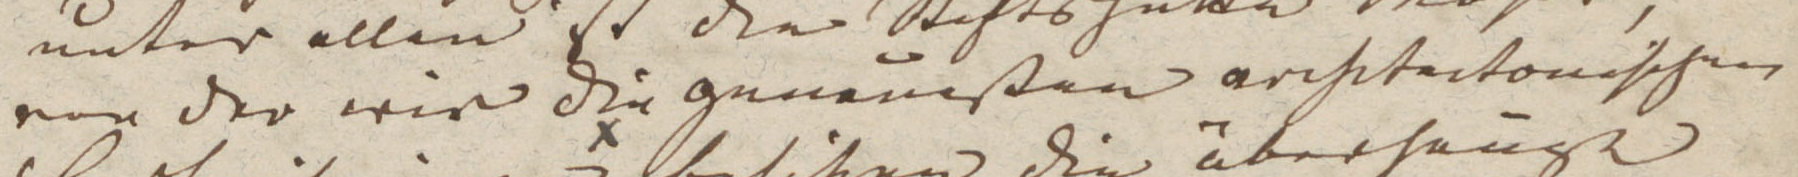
von der wir die genauesten architectonischen
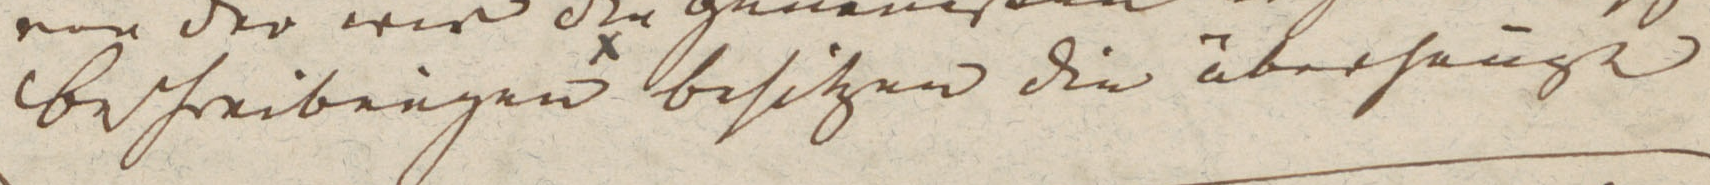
Beschreibungen % besitzen die überhaupt
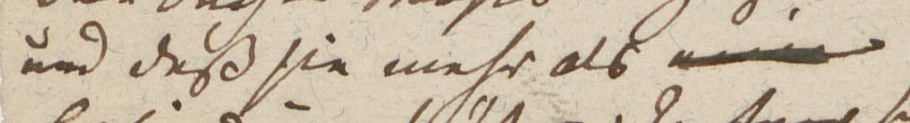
und dass sie mehr als eine
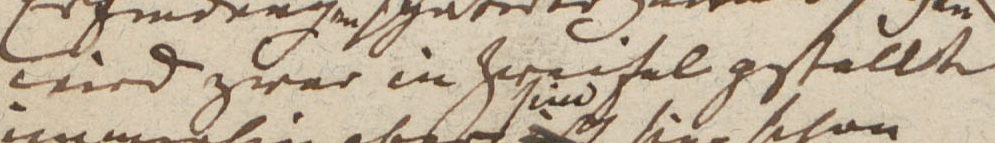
wird zwar in Zweifel gestellt
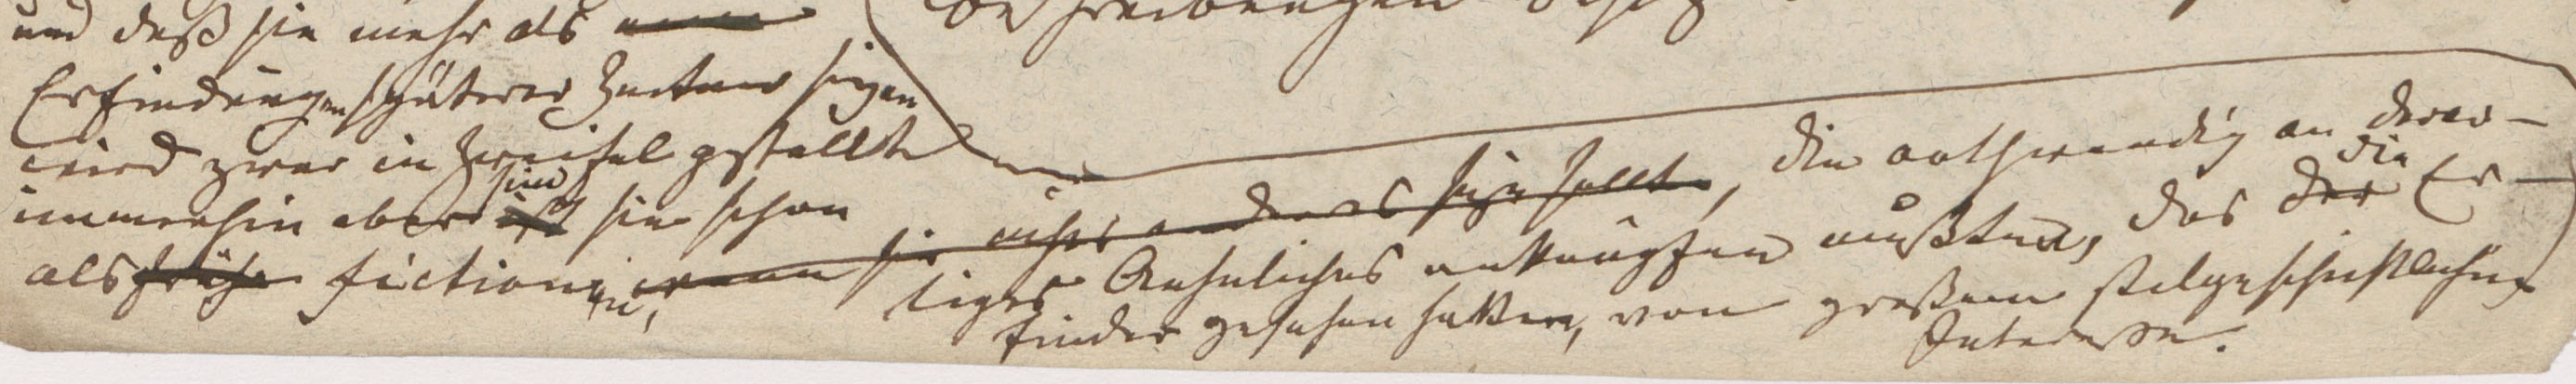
als frühe Fictionen, wenn sie n anderes seyn sollte, die nothwendig an derar-
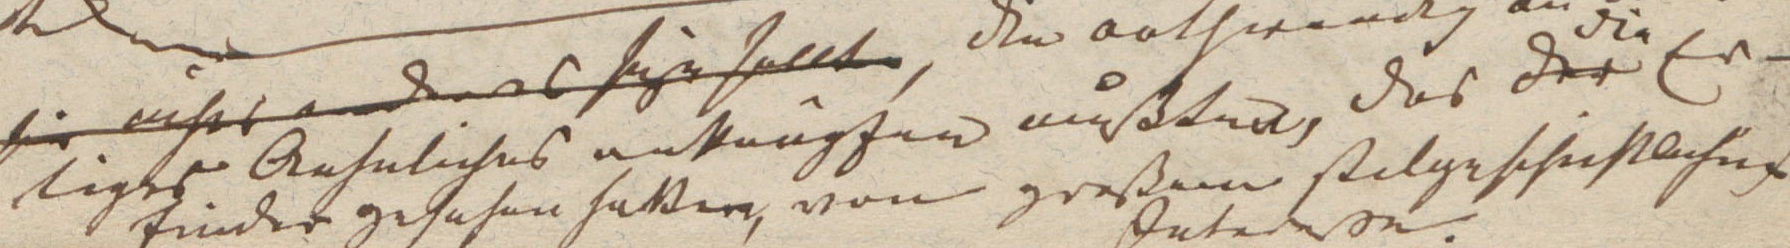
tiges Aehnliches anknüpfen mussten, das der die Er-
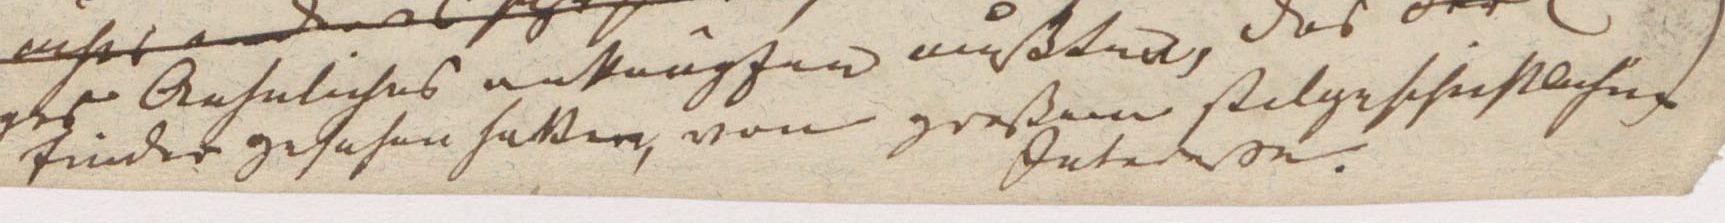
finder gesehen hatten, von grossem stilgeschichtlichen
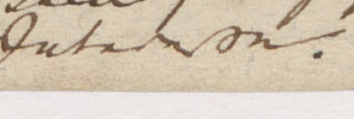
Interesse.
